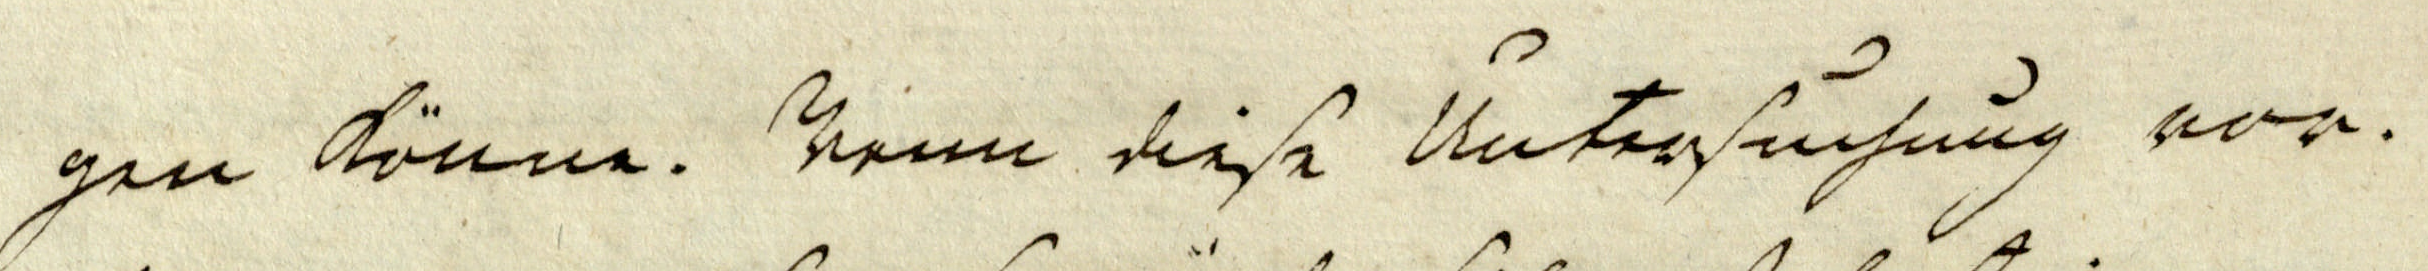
gen könne. Wenn diese Untersuchung vor¬
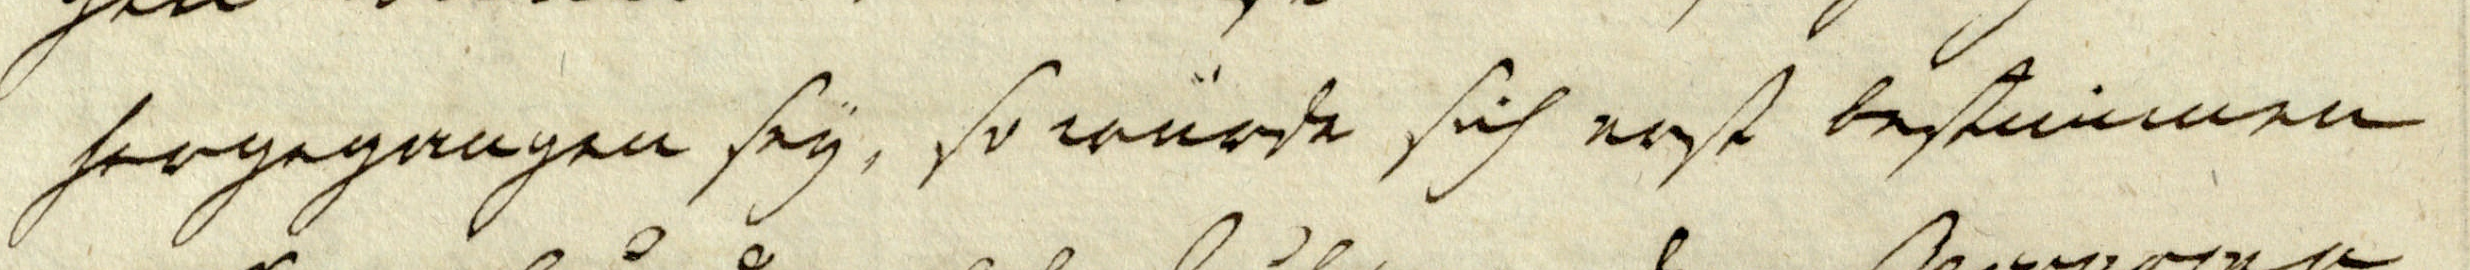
hergegangen seÿ, so würde sich erst bestimmen
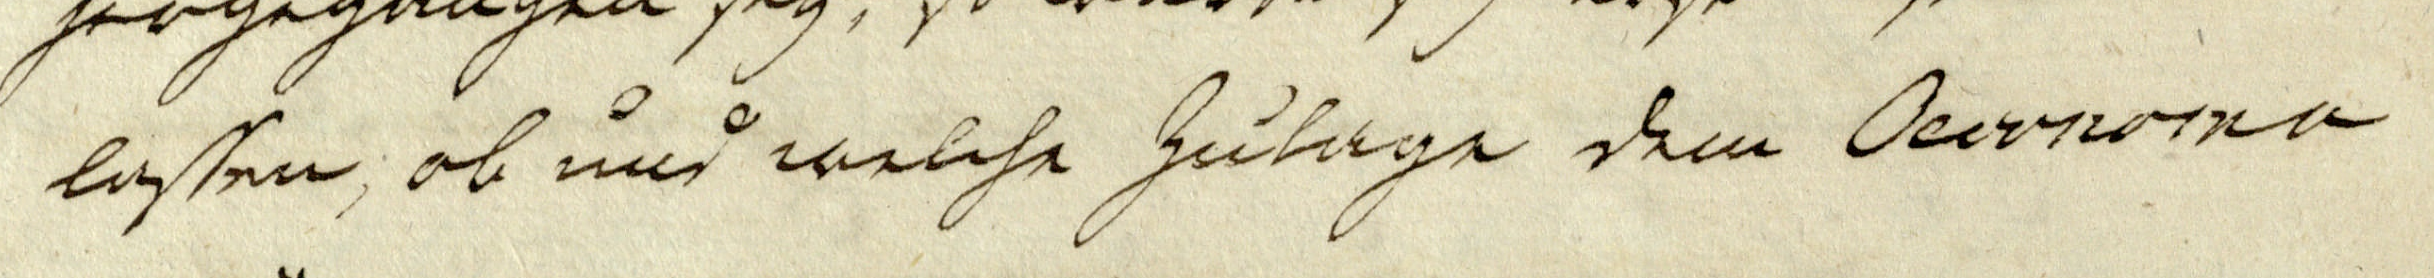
lassen, ob und welche Zulage dem Oeconomo
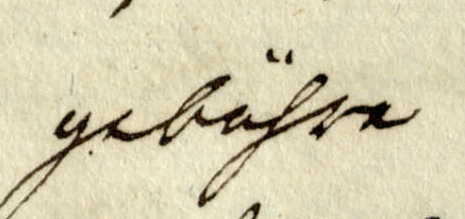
gebühre
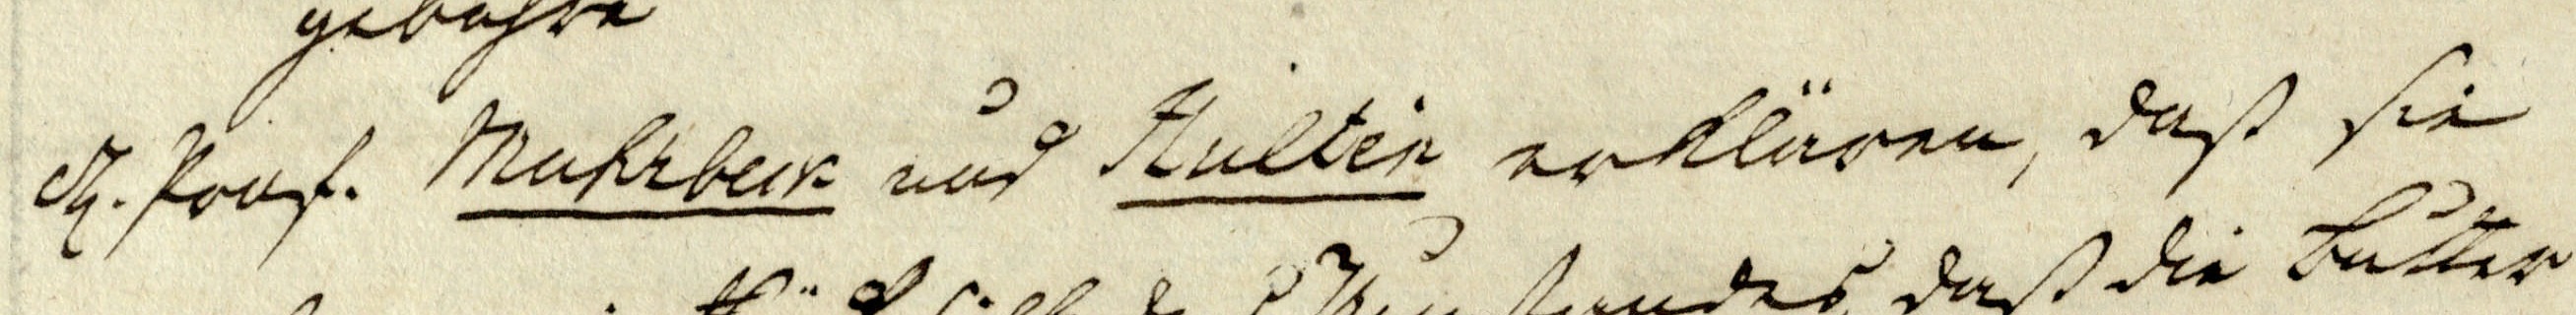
dh. Prof. Muhrbeck und Hultén erklären, daß sie
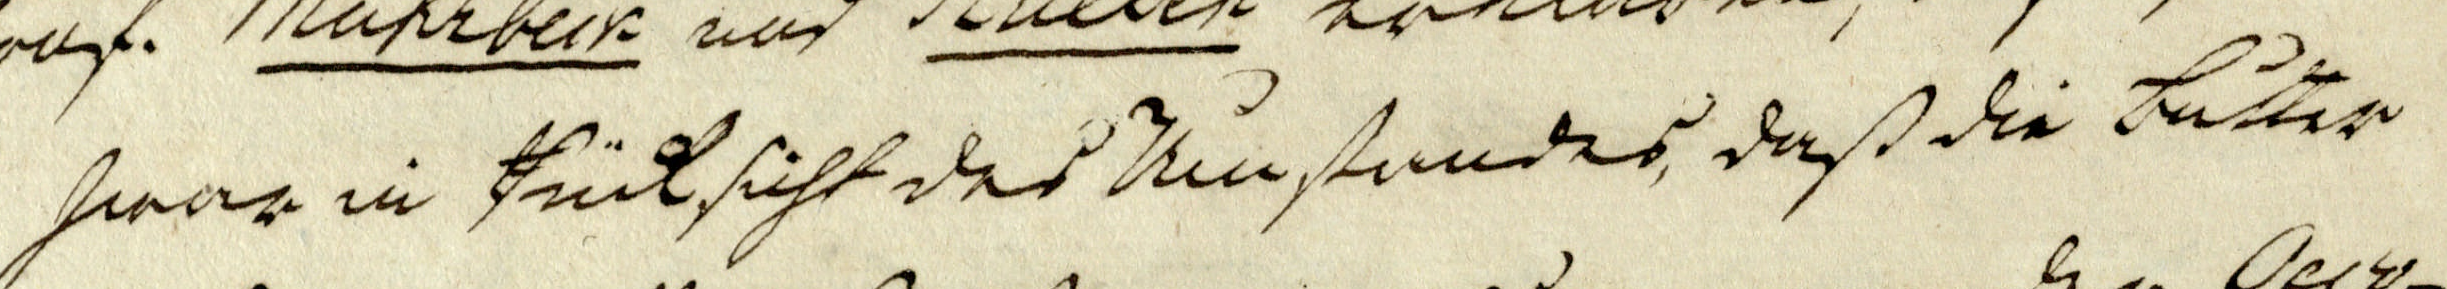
zwar in Rücksicht des Umstandes, daß die Butter
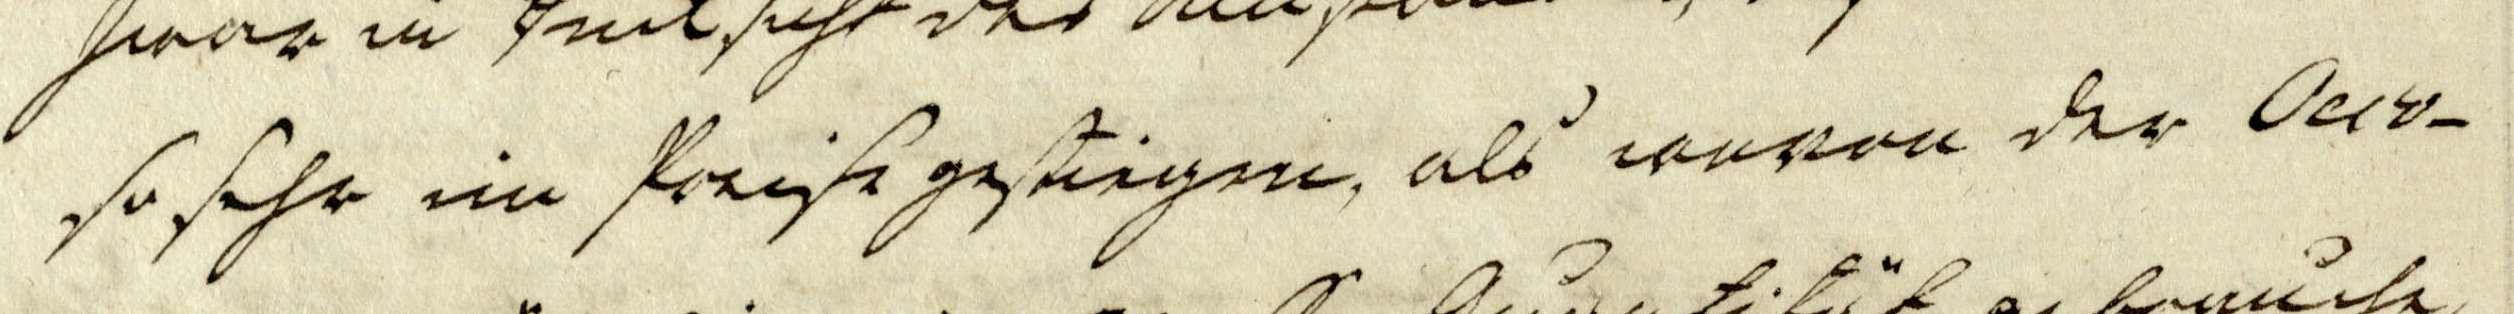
so sehr im Preise gestiegen, als wovon der Oeco¬
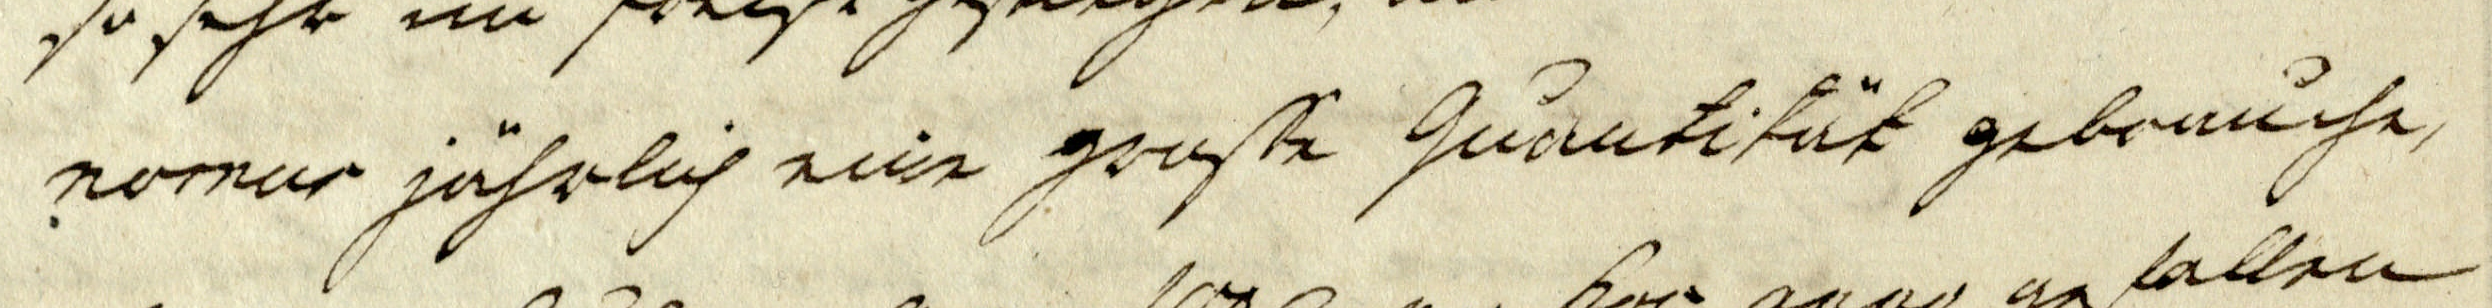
nomus jährlich eine grosse Quantität gebrauche,
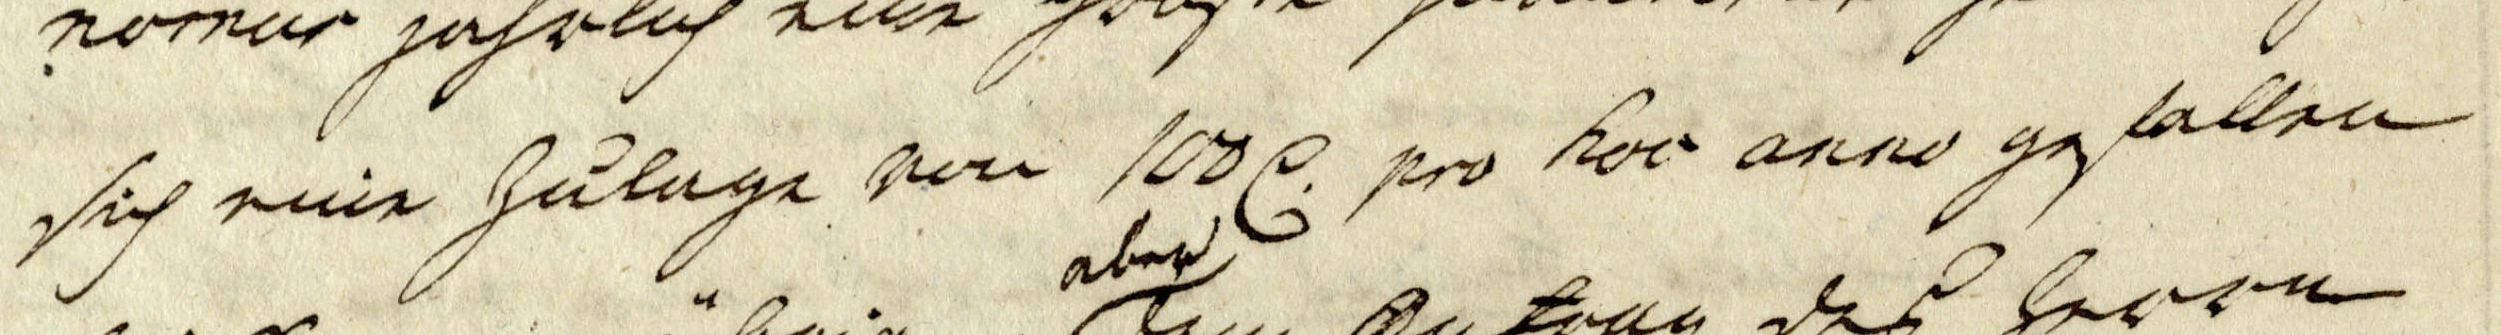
sich eine Zulage von 100 l. pro hoc anno gefallen
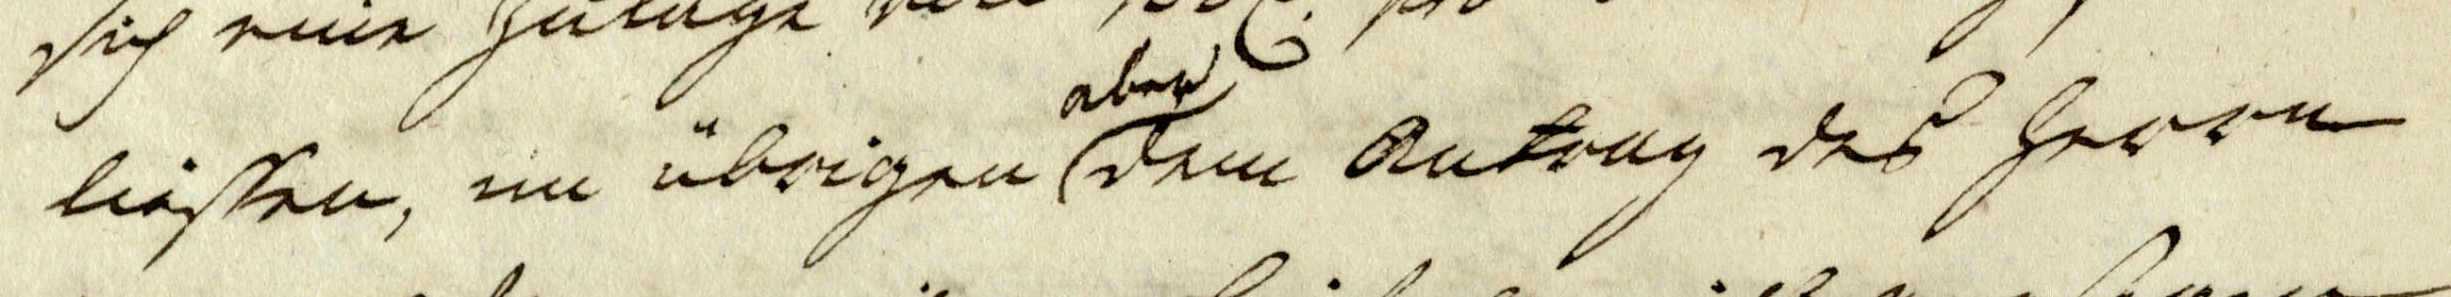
liessen, im übrigen aber dem Antrag des Herrn
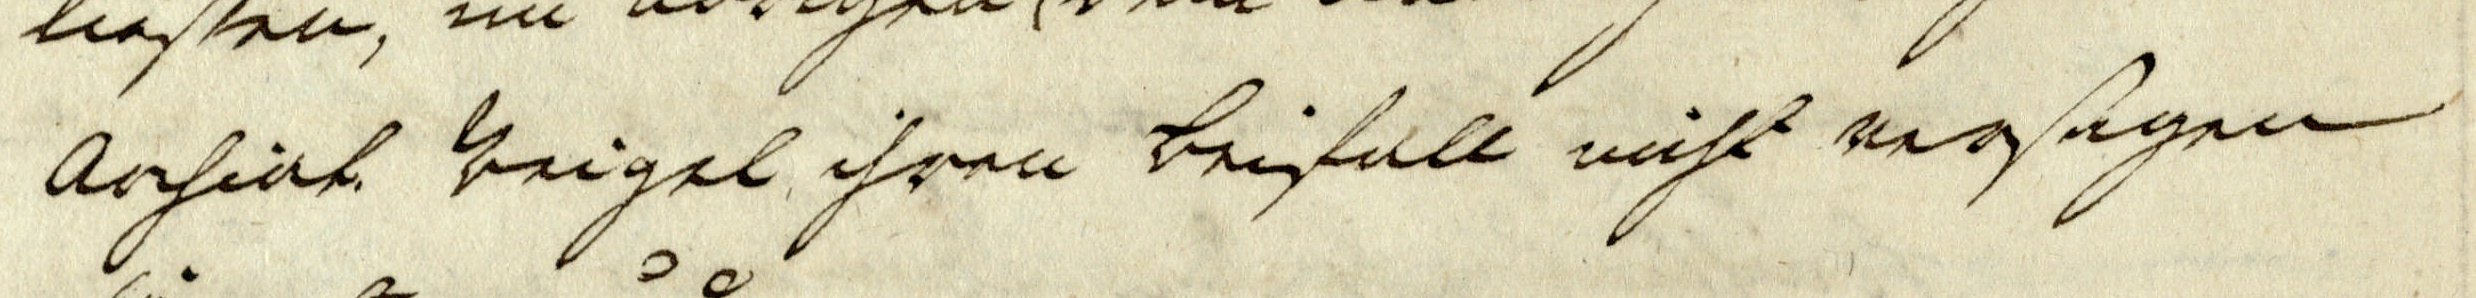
Archiat. Weigel ihren Beifall nicht versagen
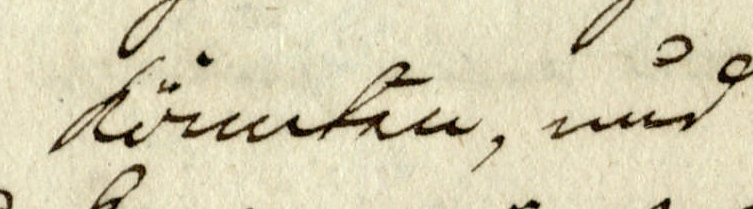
könnten, und
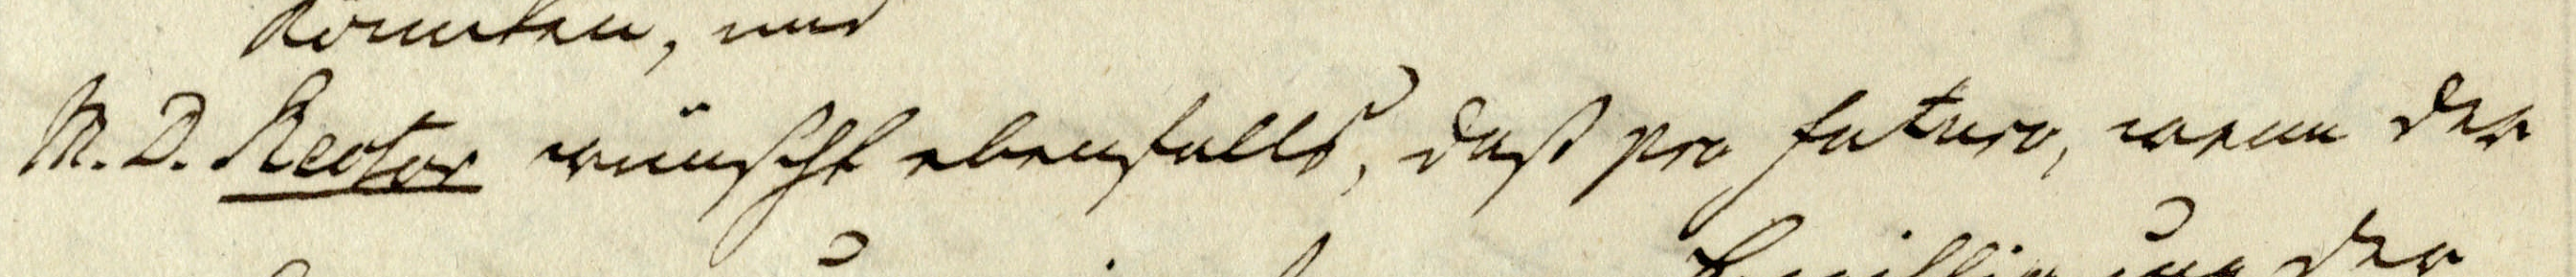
M. D. Rector wünscht ebenfalls, daß pro futuro, wenn der
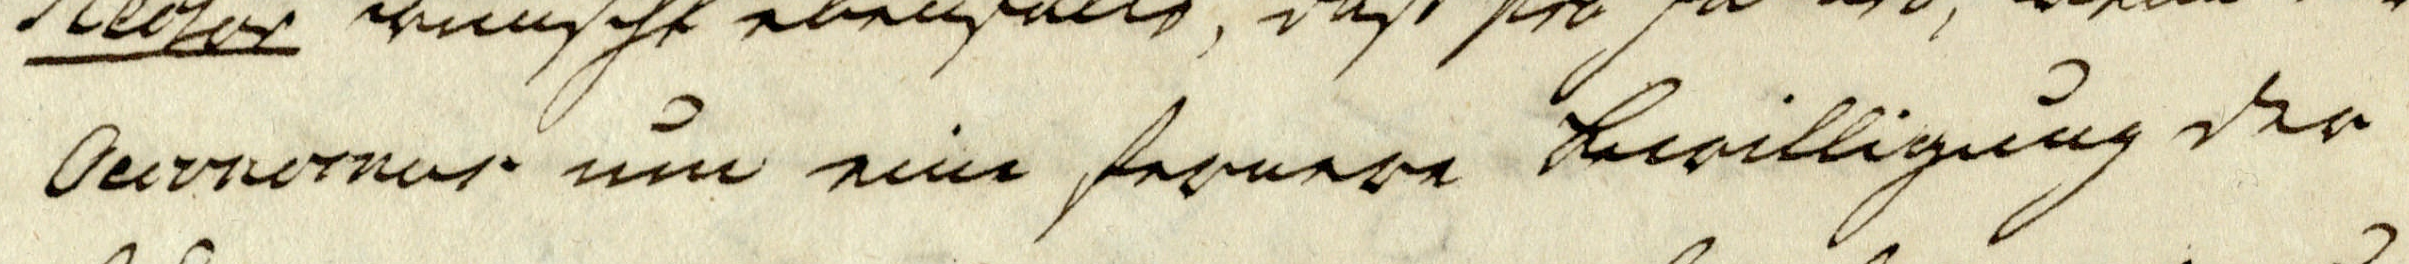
Oeconomus um eine fernere Bewilligung der
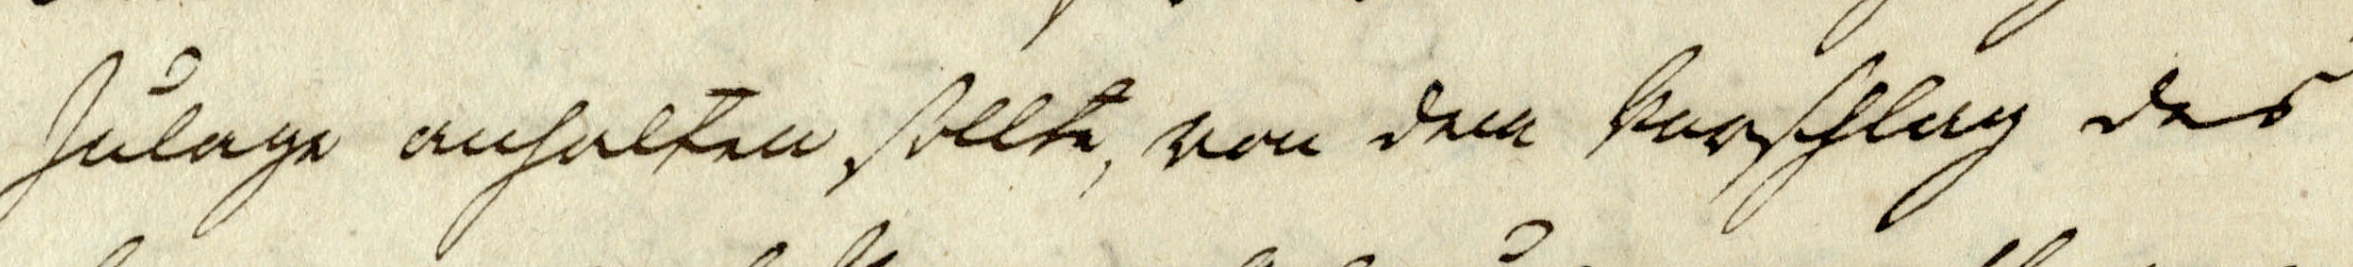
Zulage anhalten sollte, von dem Vorschlag des
